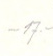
-17.-
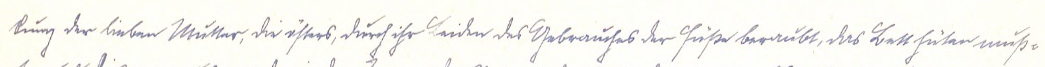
kung der lieben Mutter, die öfters durch ihr Leiden des Gebrauches der Füße beraubt, das Bett hüten muß-
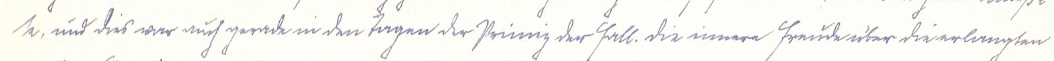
te, und dies war auch gerade in den Tagen der Primiz der Fall. Die innere Freüde über die erlangten
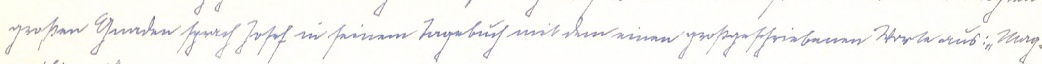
großen Gnaden sprach Josef in seinem Tagebuch mit dem einen großgeschriebenen Worte aus: "Mag-
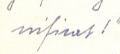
nificat!"
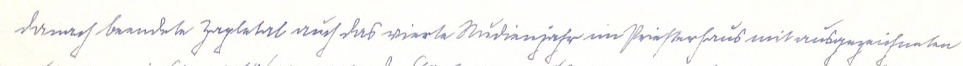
Danach beendete Zapletal auch das vierte Studienjahr im Priesterhaus mit ausgezeichneten
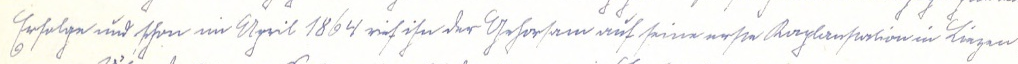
Erfolgen und schon im April 1864 rief ihn der Gehorsam auf seine erste Kaplanstation in Liezen.
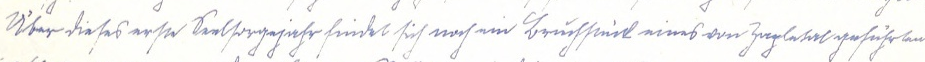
Über dieses erste Seelsorgejahr findet sich noch ein Bruchstück eines von Zapletal geführten
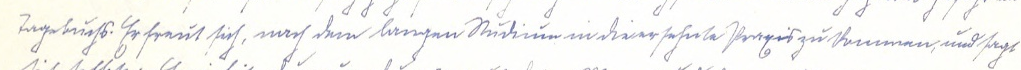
Tagebuchs. Erf freut sich, nach dem langen Studium in die ersehnte Prasix zu kommen, und sagt
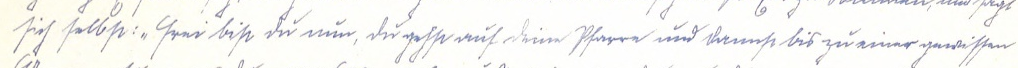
sich selbst: "Frei bist du nun, du gehst uf deine Pfarre und kannst bis zu einer gewissen
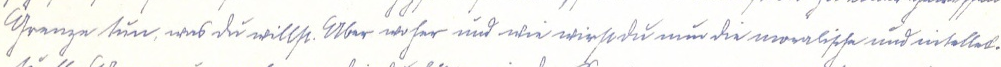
Grenze tun, was du willst. Aber woher und wie wirst du nun die menschliche und intellek-
